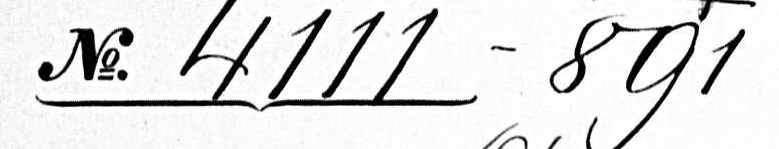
No. 4111 - 1891
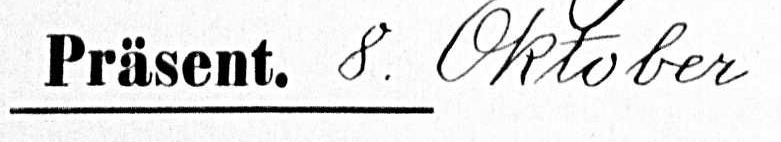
Präsent. 8. Oktober
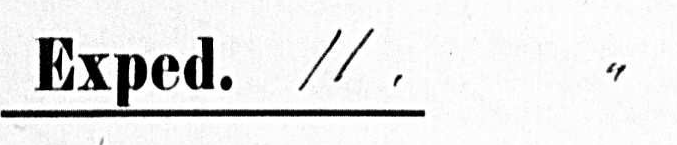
Exped. 11. „
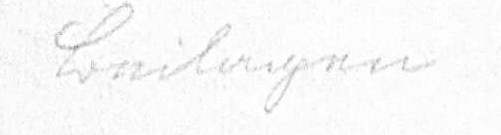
Beilagen
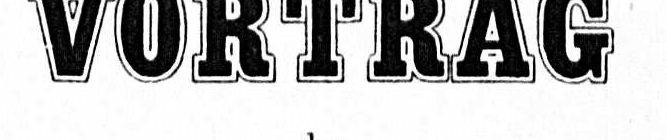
VORTRAG
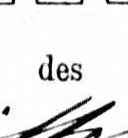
des
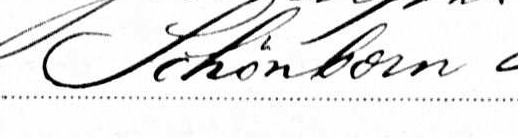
Schönborn
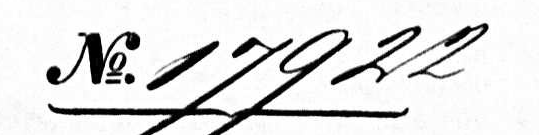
No. 17922
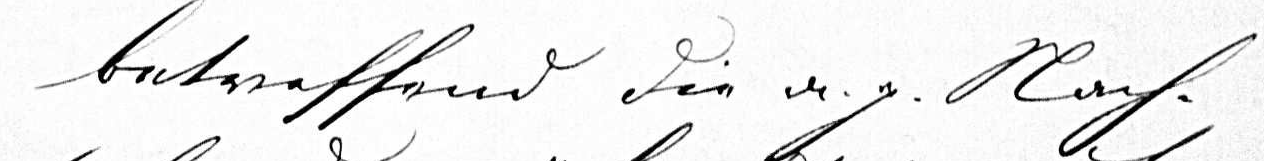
betreffend die a.g. Nach¬
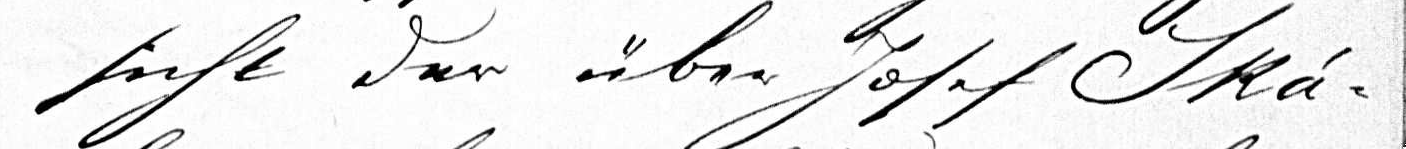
sicht der über Josef Ská¬
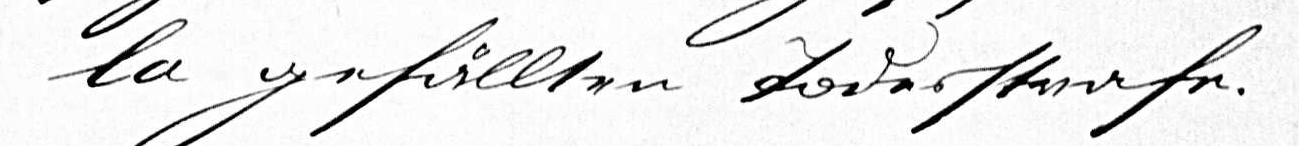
la gefällten Todesstrafe.
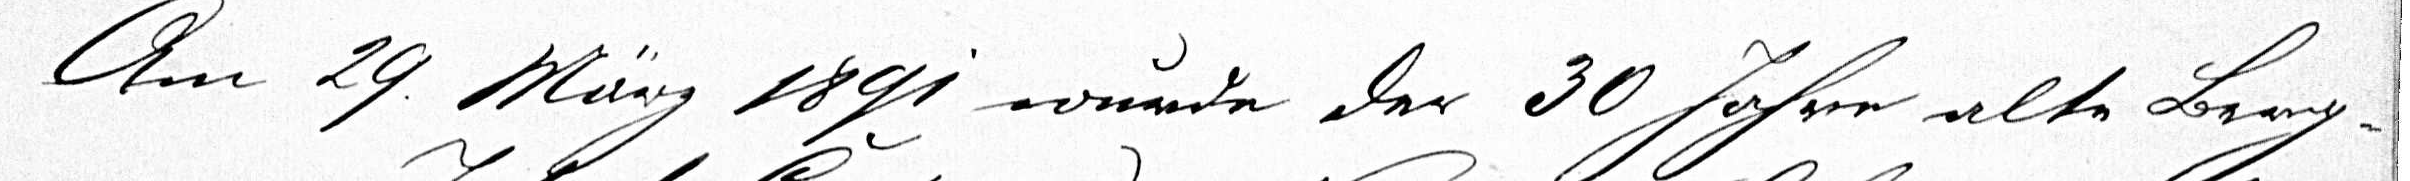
Am 29. März 1891 wurde der 30 Jahre alte Berg¬
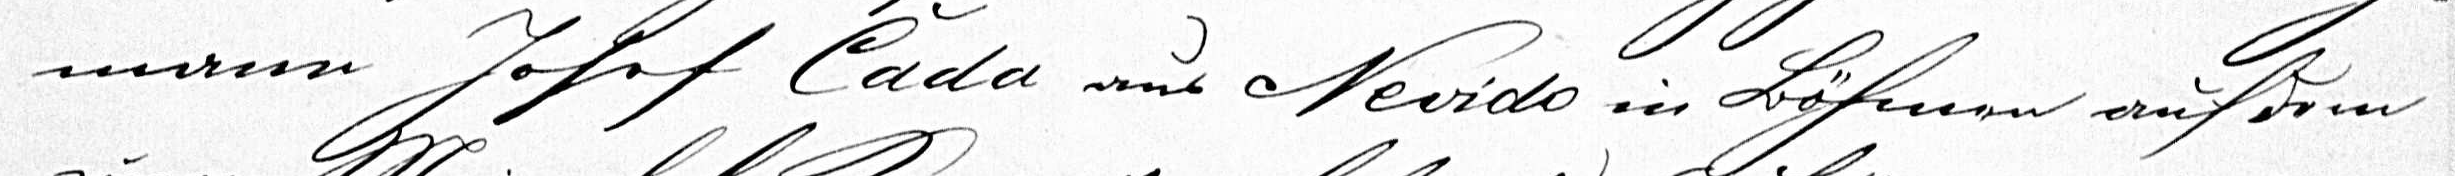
mann Josef Čada aus Nevido in Böhmen auf dem
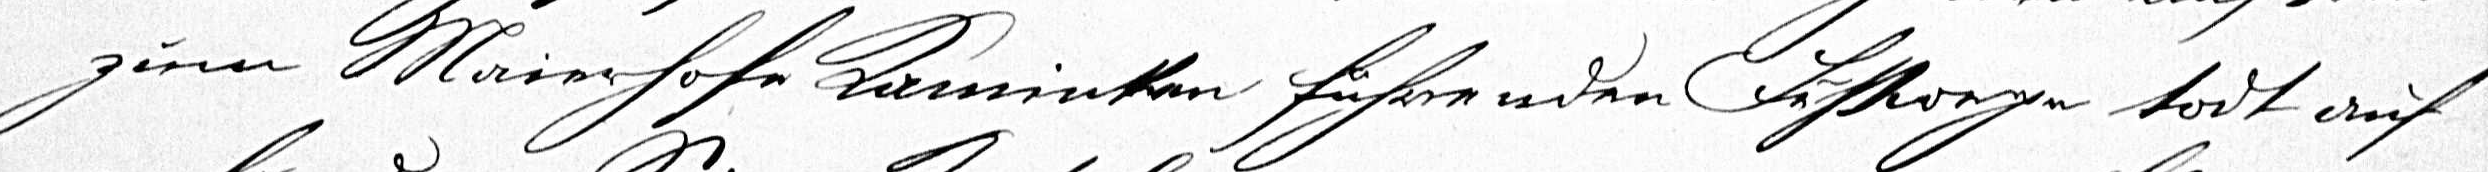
zum Maierhofe Kaminken führenden Fußwege todt auf
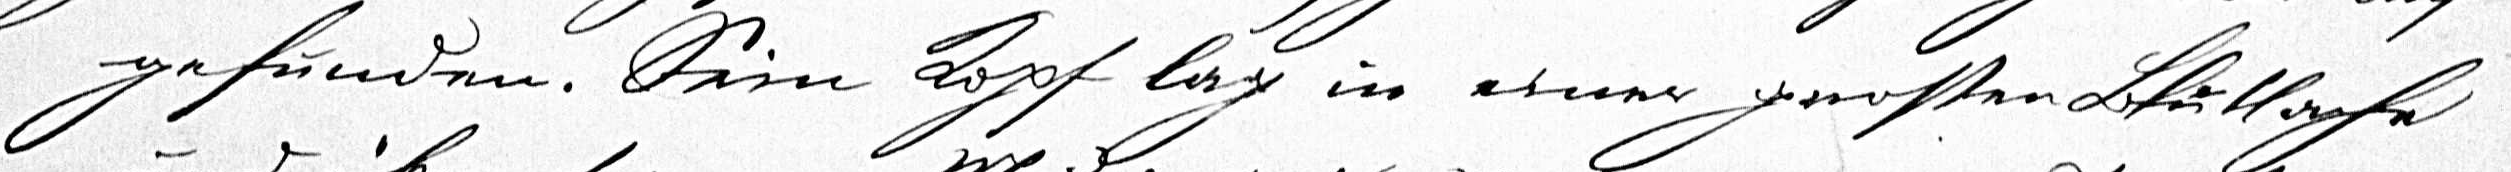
gefunden. Sein Kopf lag in einer großen Blutlacke
